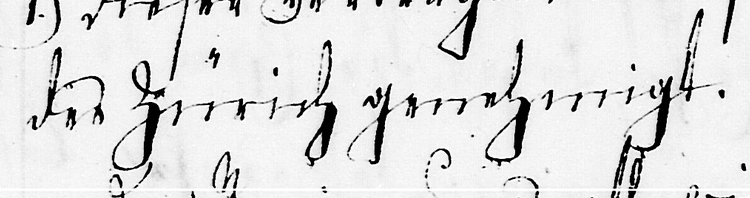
des Zürich genehmigt.
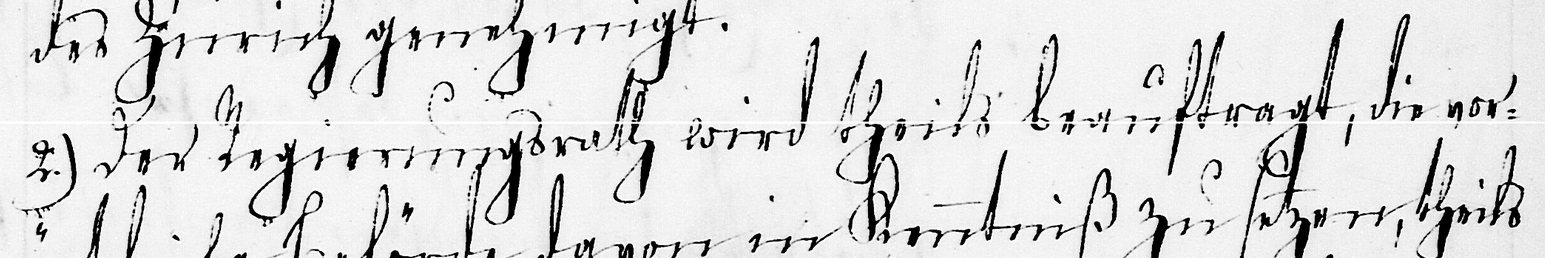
2.) Der Regierungsrath wird theils beauftragt, die vor¬
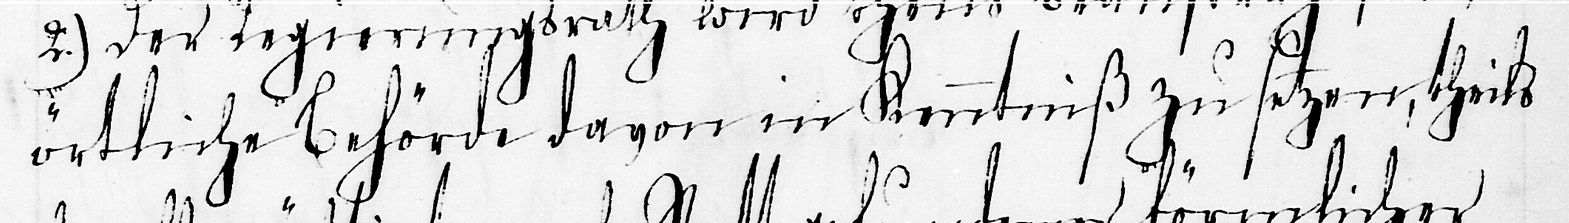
örtliche Behörde davon in Kenntniß zu setzen, theils
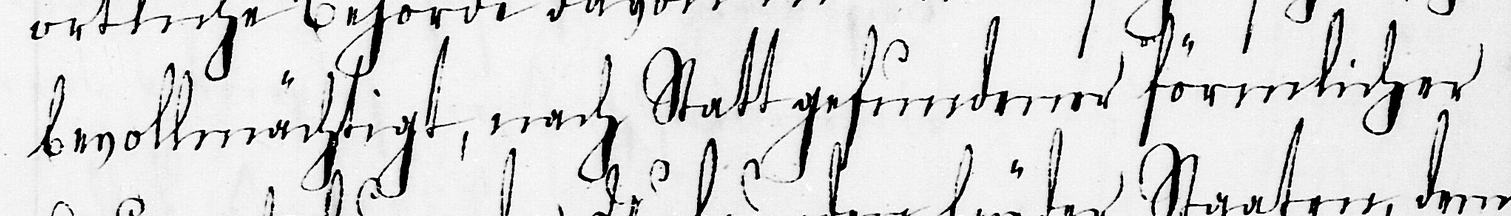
bevollmächtigt, nach Statt gefundener förmlicher
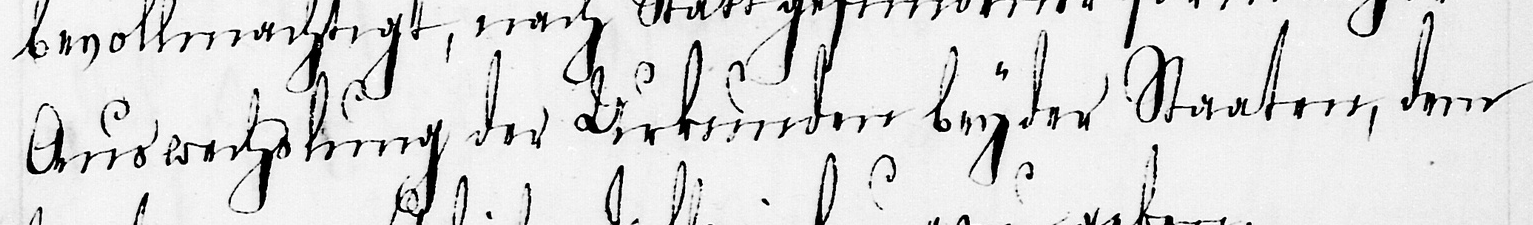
Auswechslung der Urkunden beyder Staaten, dem
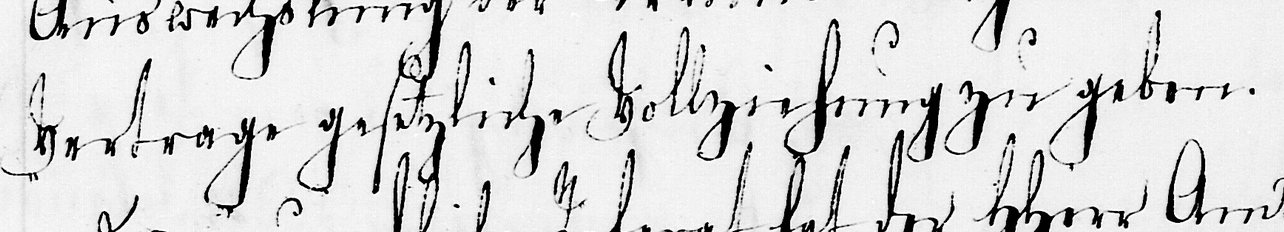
Vertrage gesetzliche Vollziehung zu geben.
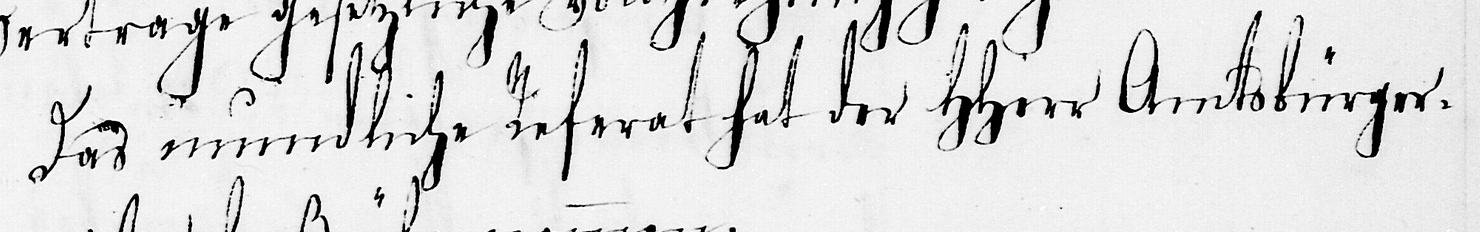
Das mundliche Referat hat der HHerr Amtsbürger¬
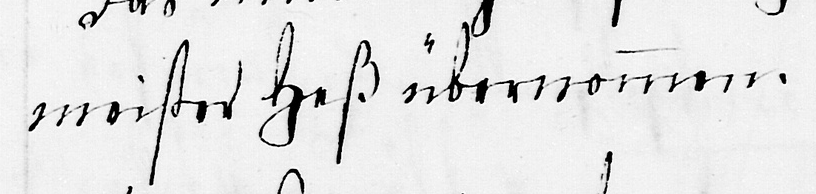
meister Heß übernommen.
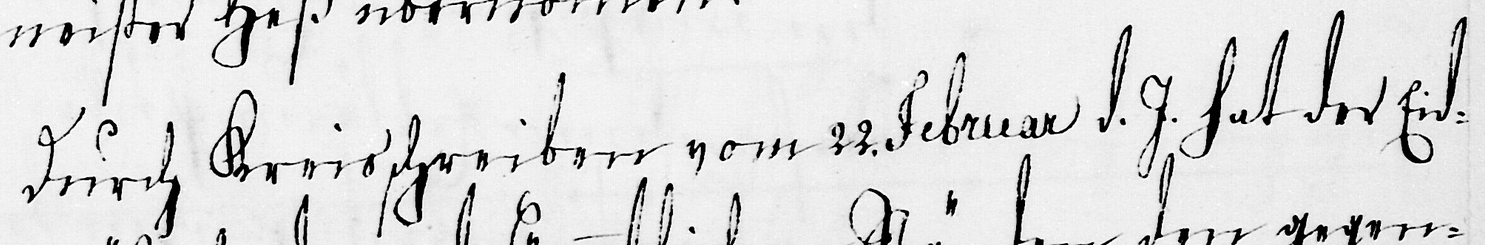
Durch Kreisschreiben vom 22. Februar d. J. hat der Eid¬
